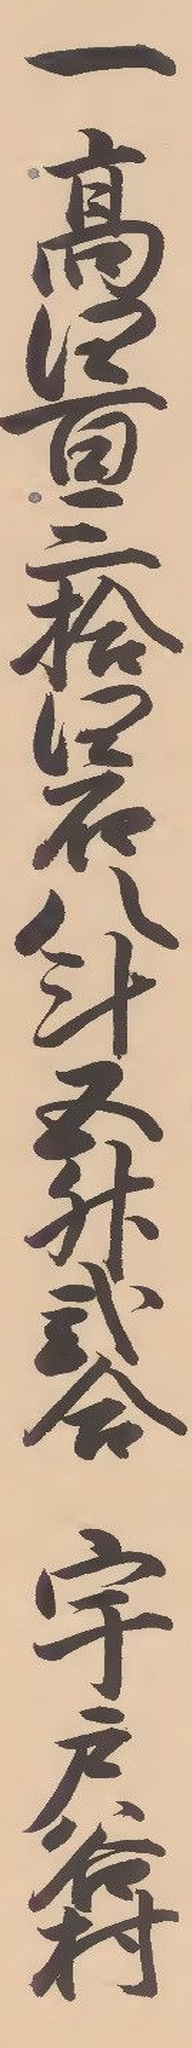一高四百三拾四石八斗五升弐合宇戸谷村

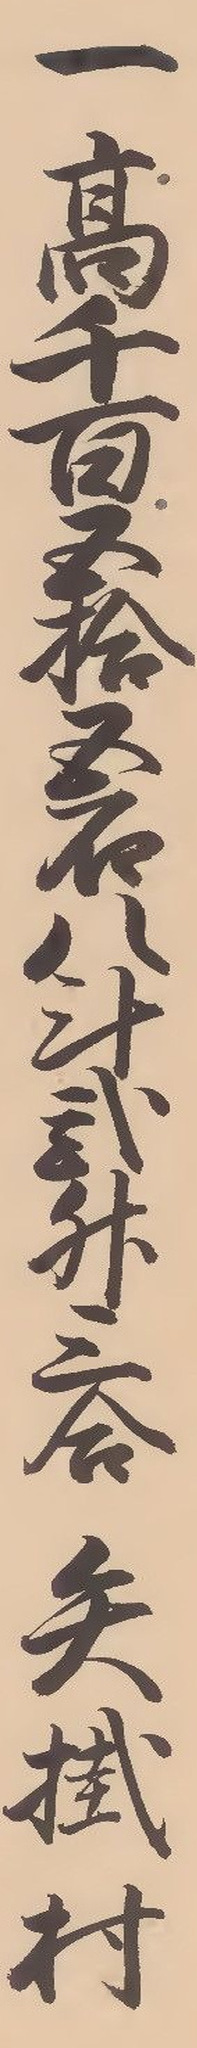一高千百五拾五石八斗弐升三合矢掛村
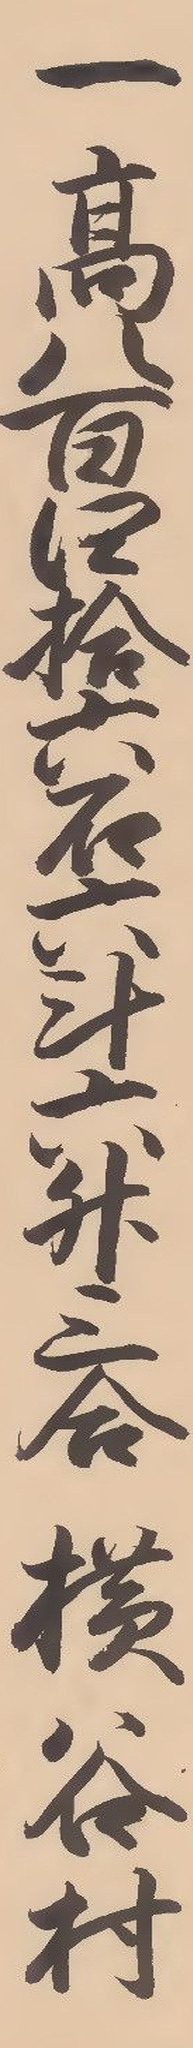一高八百四拾六石六斗六升三合横谷村
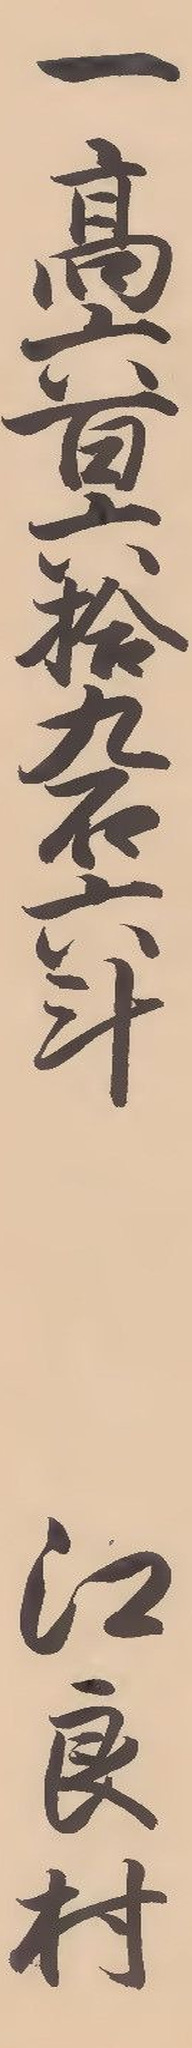一高六百六拾九石六斗江良村
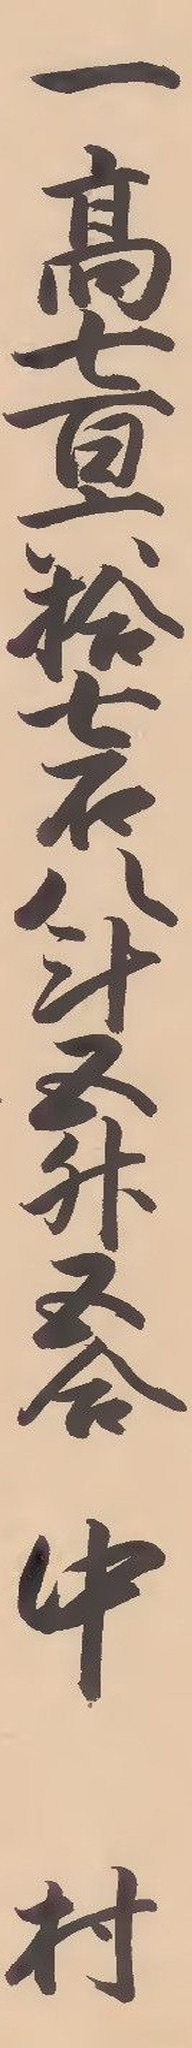一高七百六拾七石八斗五升五合中村
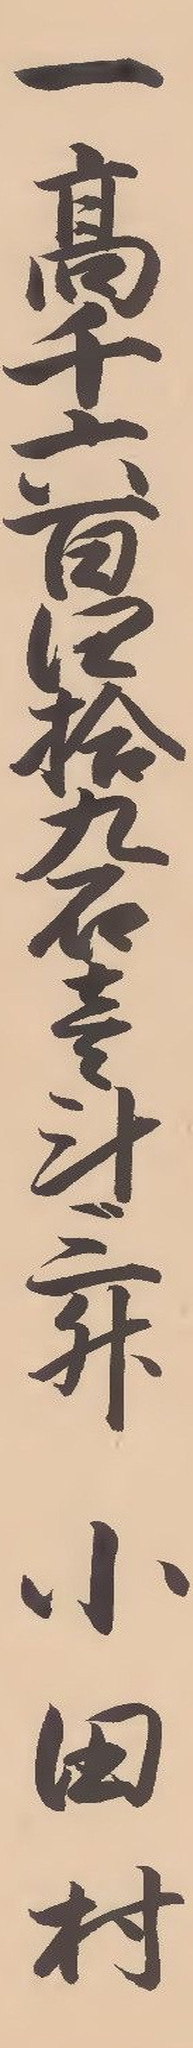一高千六百四拾九石壱斗三升小田村
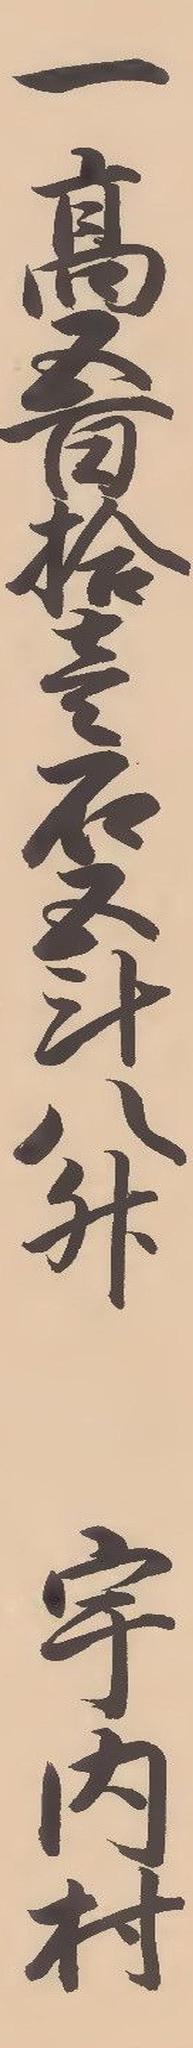一高五百拾壱石五斗八升宇内村
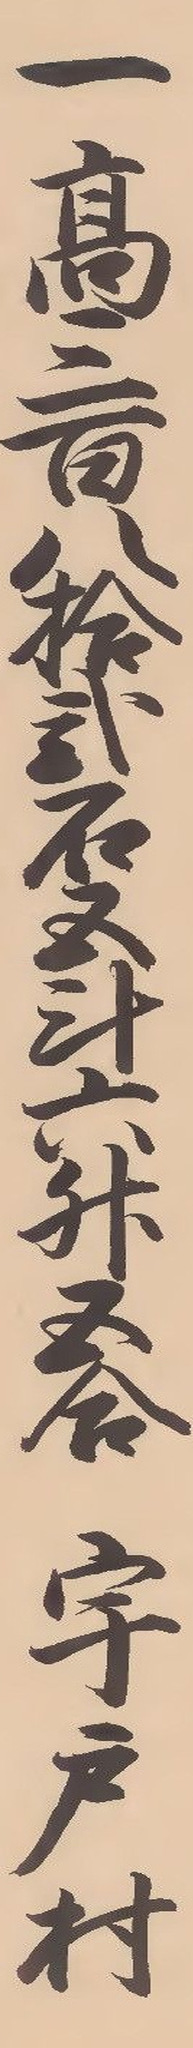一高三百八拾弐石五斗六升五合宇戸村
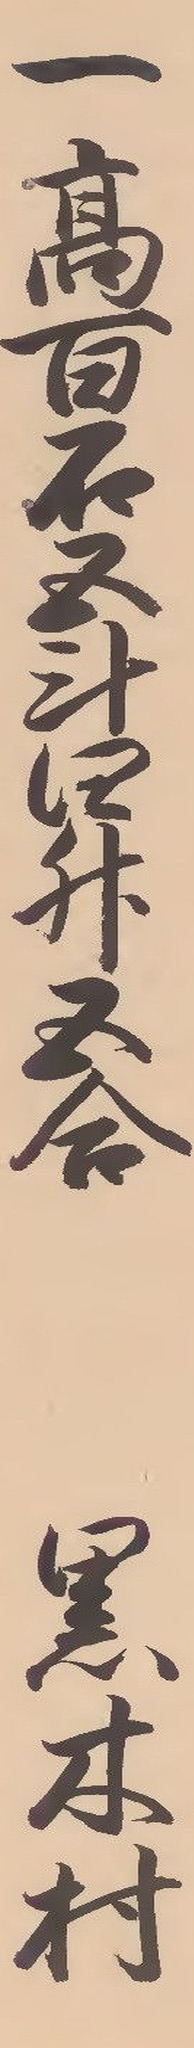一高百石五斗四升五合黒木村

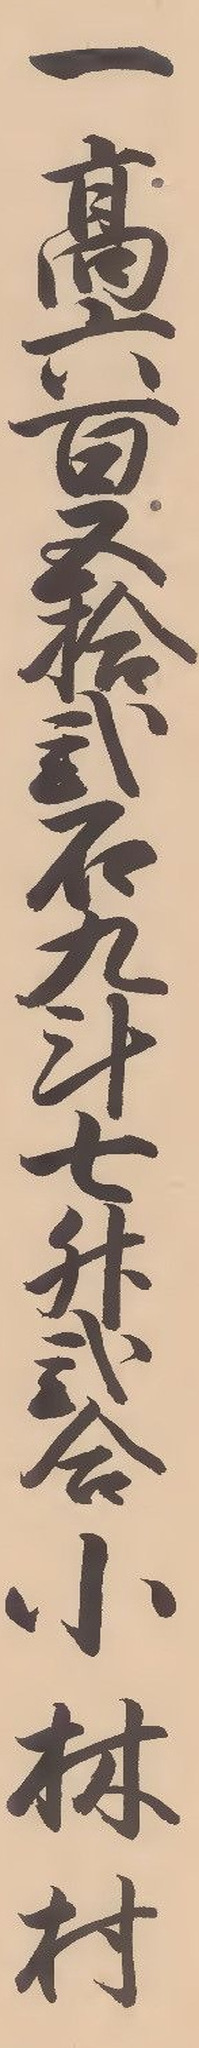一高六百五拾弐石九斗七升弐合小林村
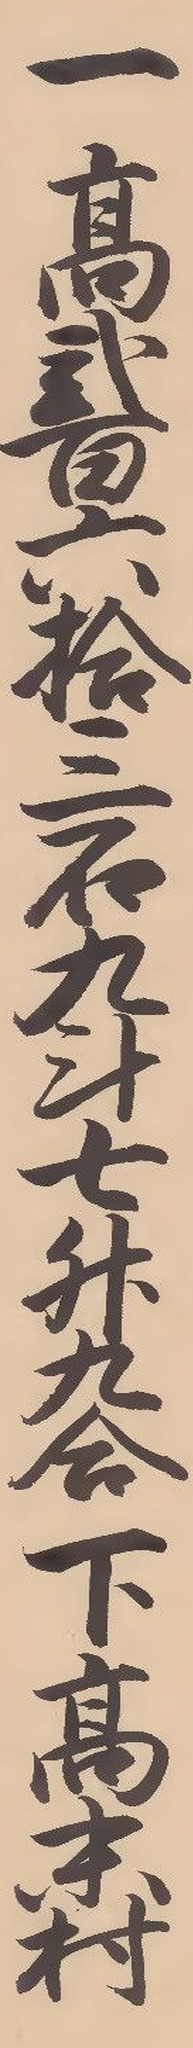一高弐百六拾三石九斗七升九合下高末村
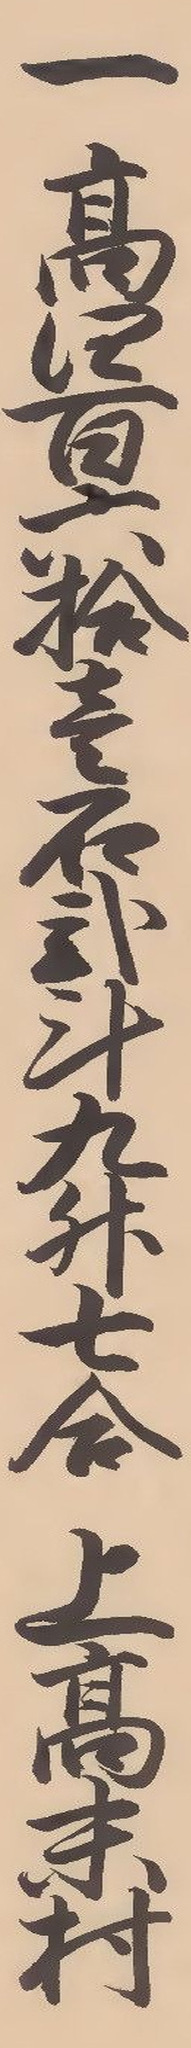一高四百六拾壱石弐斗九升七合上高末村
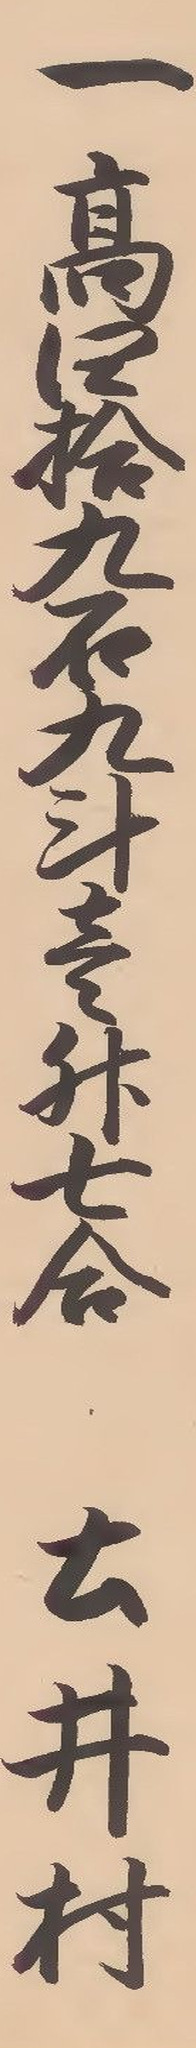一高四拾九石九斗壱升七合土井村
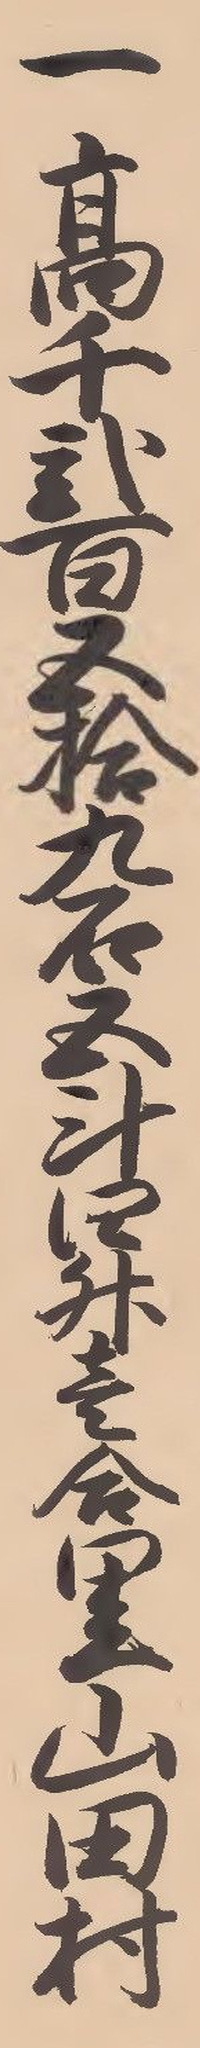一高千弐百五拾九石五斗四升壱合里山田村
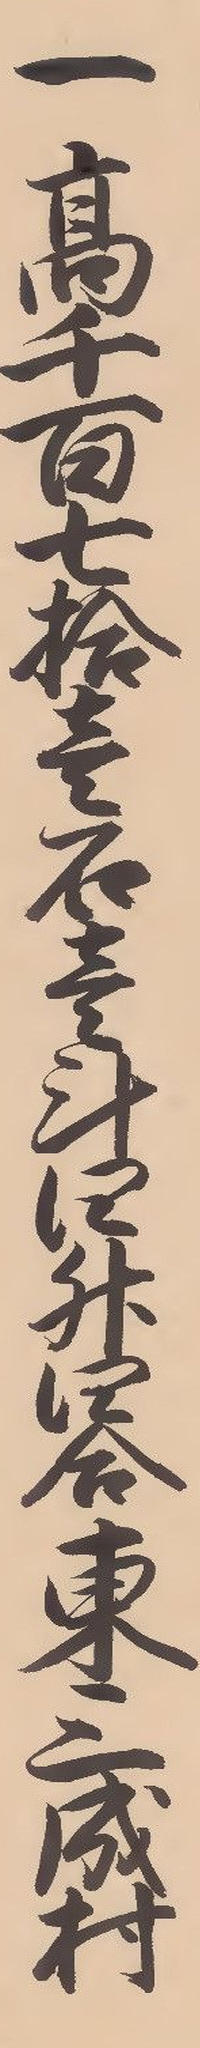一高千百七拾壱石壱斗四升四合東三成村
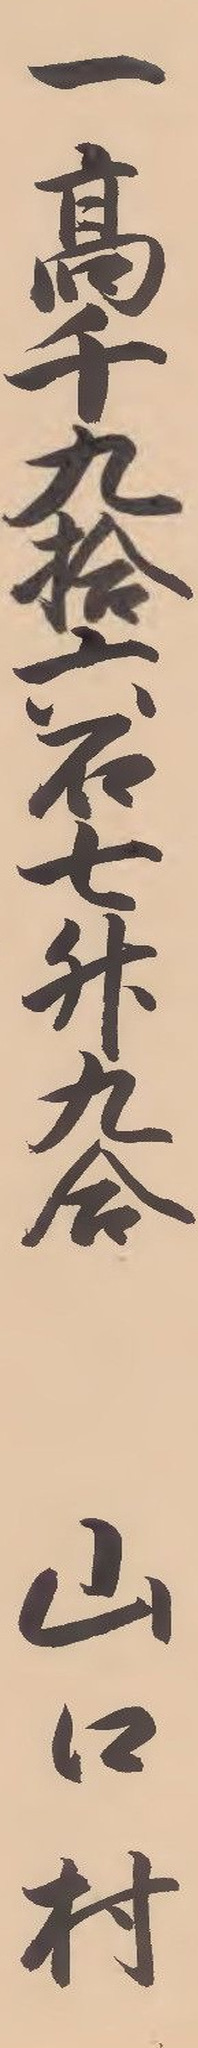一高千九拾六石七升九合山口村
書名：備中国郷帳
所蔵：国立公文書館 National Archives of Japan
